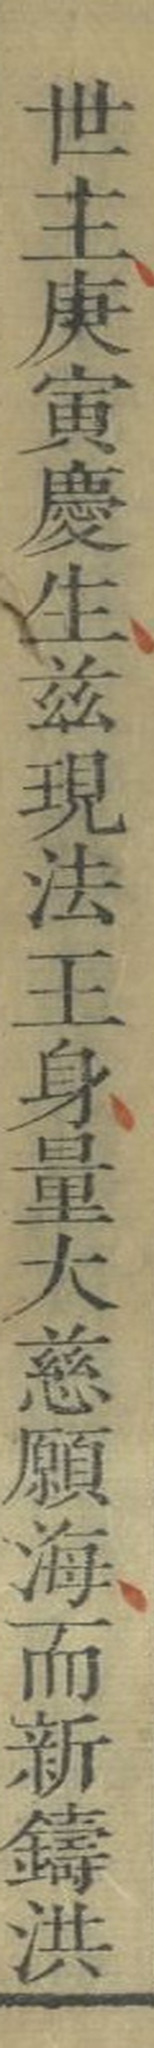世主庚寅慶生茲現法王身量大慈願海而新鑄洪
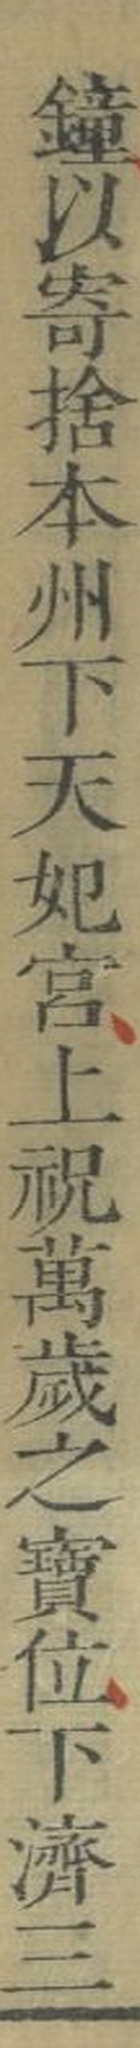鐘以寄捨本州下天妃宮上祝萬歲之寶位下濟三
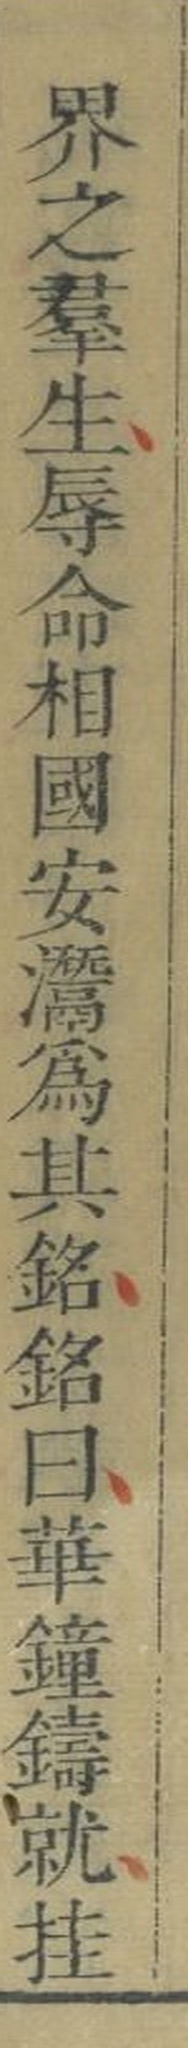界之羣生辱命相國安灊爲其銘銘曰華鐘鑄就挂
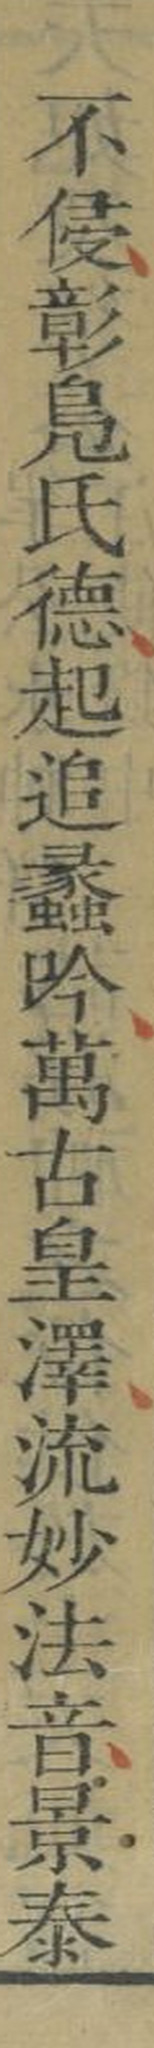不侵彰鳬氏德起追蠡吟萬古皇澤流妙法音景泰
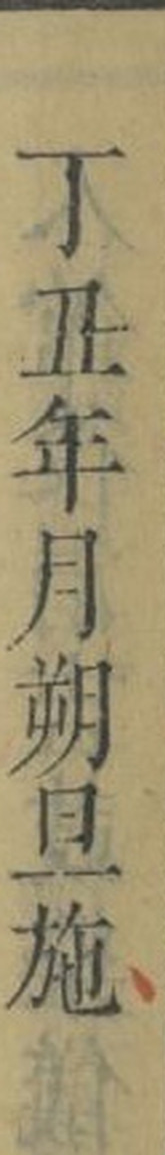丁丑年月朔旦施
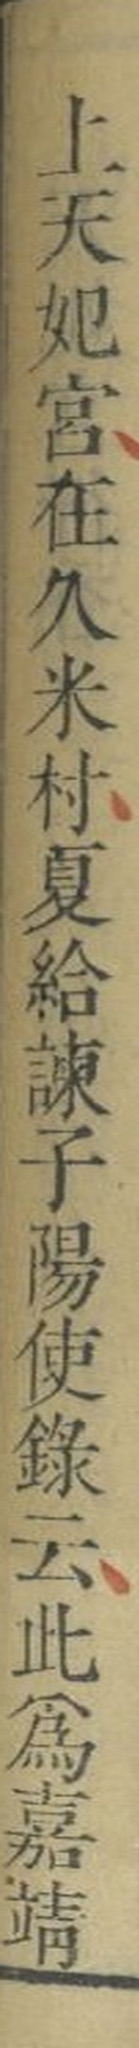上天妃宮在久米村夏給諫子陽使錄云此爲嘉靖
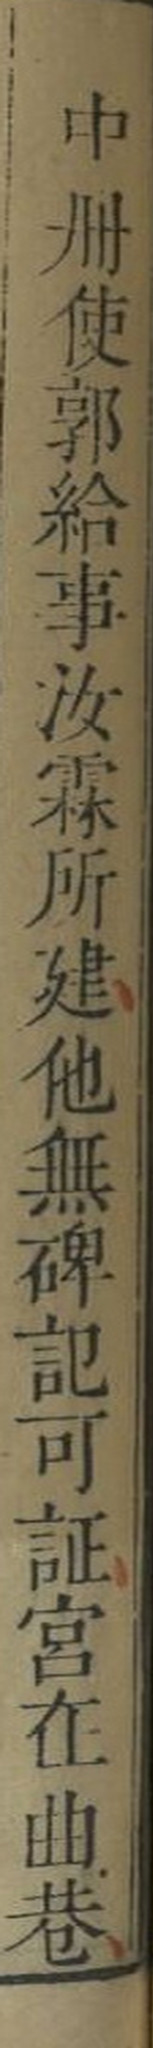中冊使郭給事汝霖所建他無碑記可証宮在曲巷
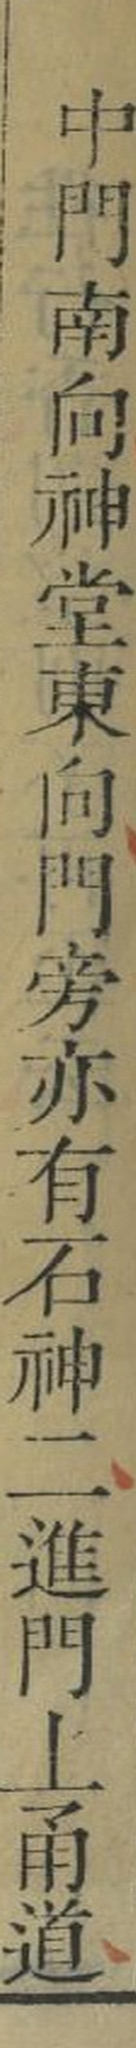中門南向神堂東向門旁亦有石神二進門上甬道
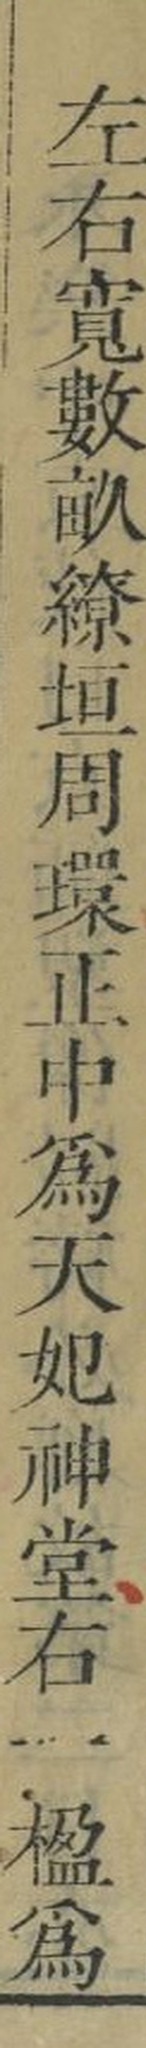左右寬數畝繚垣周環正中爲天妃神堂右一楹爲
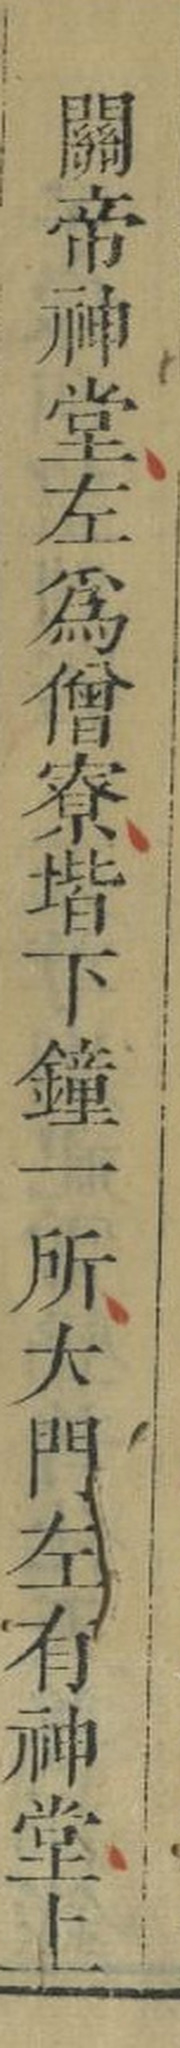關帝神堂左爲僧寮堦下鐘一所大門左有神堂上
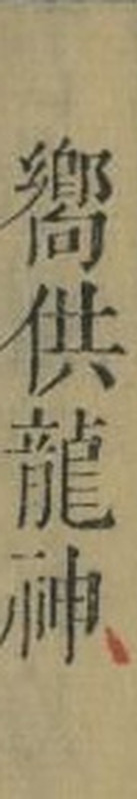嚮供龍神
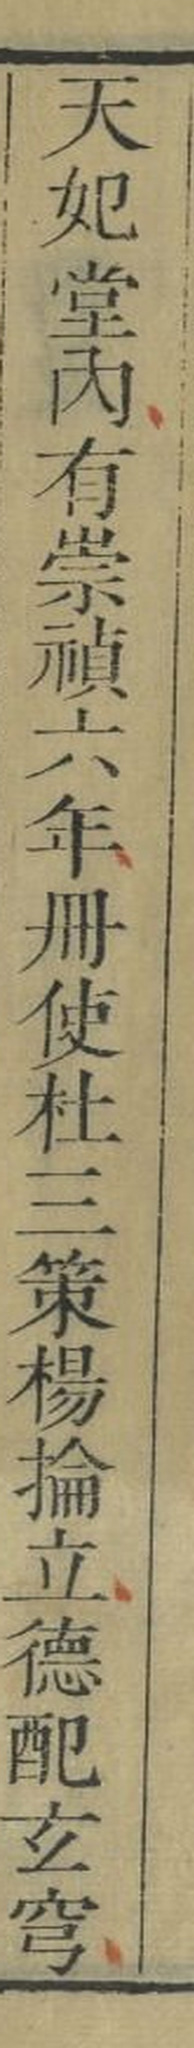天妃堂内有崇禎六年冊使杜三策楊掄立德配玄穹
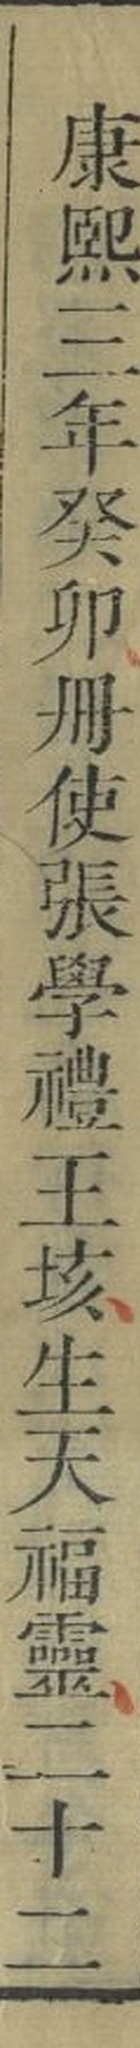康煕三年癸卯冊使張學禮王垓生天福靈二十二
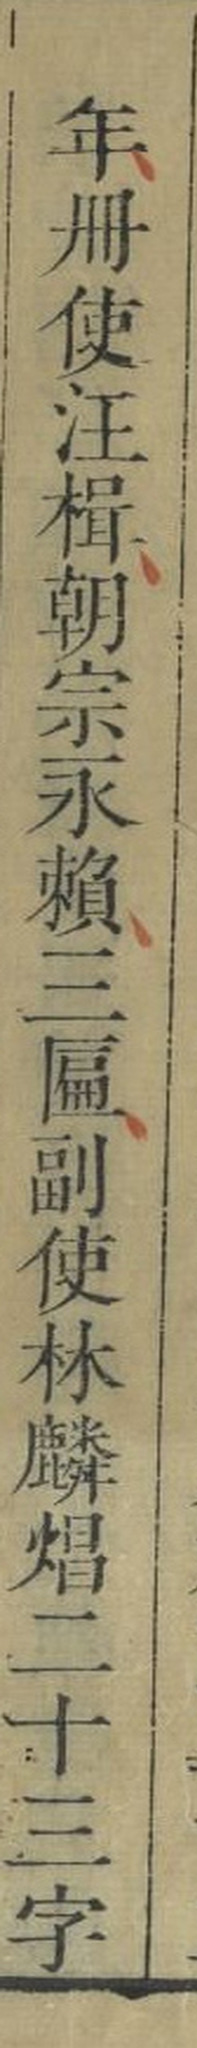年冊使汪楫朝宗永賴三匾副使林麟焻二十三字
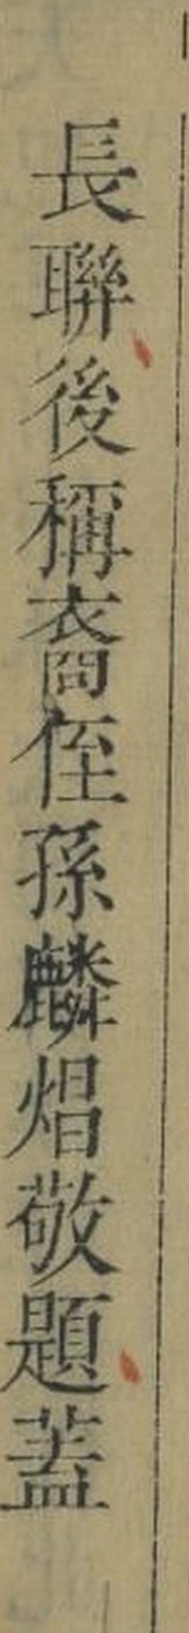長聯後稱裔侄孫麟焻敬題蓋

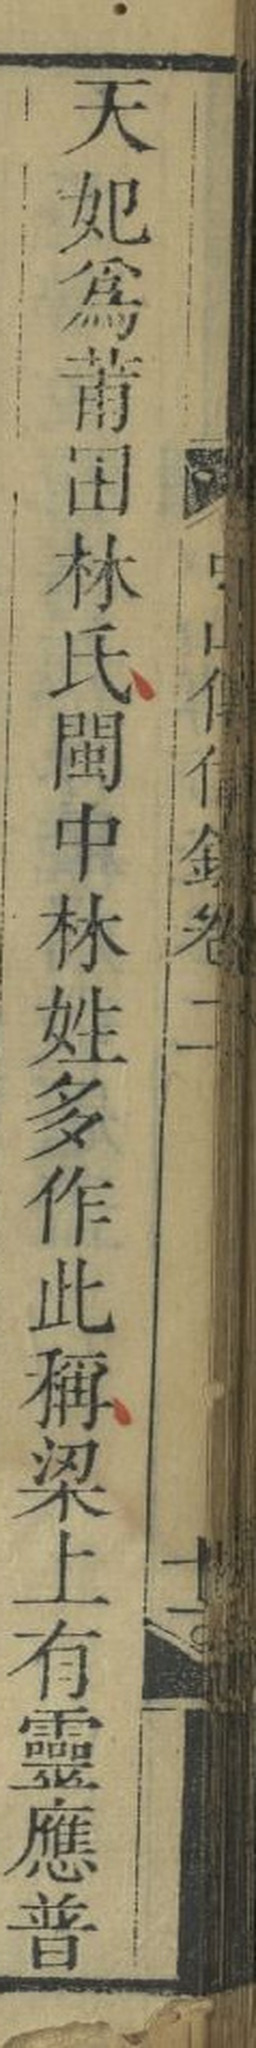天妃爲莆田林氏閩中林姓多作此稱梁上有靈應普
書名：中山伝信録 巻一、巻二
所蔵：University of the Ryukyus Library
